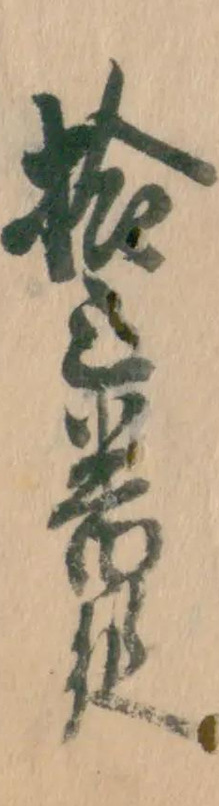拾三番組

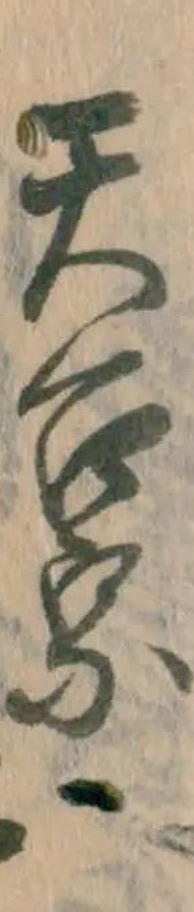天台宗
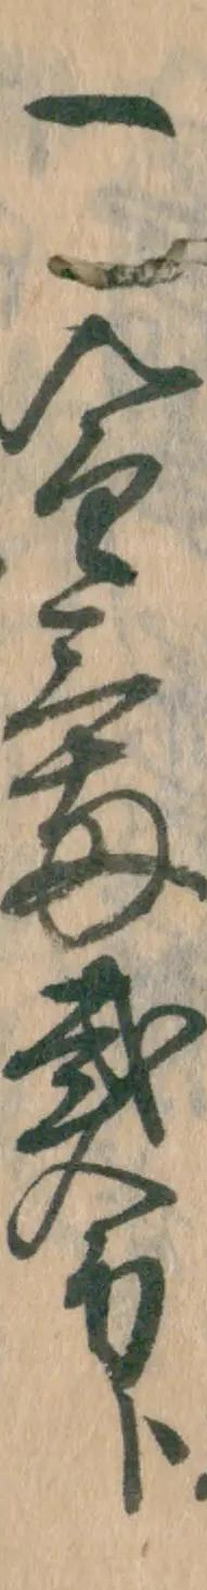一金三両弐分八人
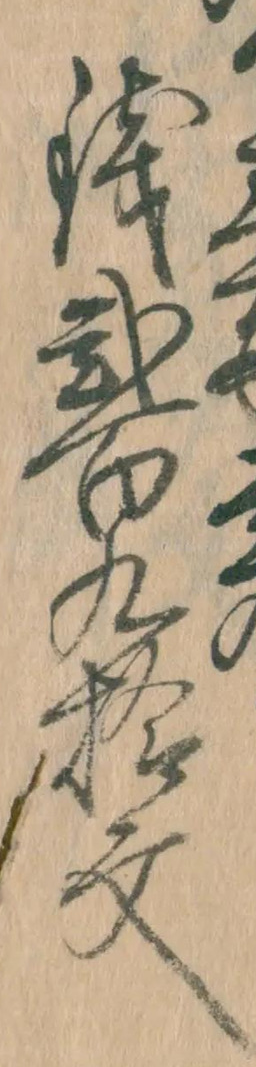銭弐百九拾文

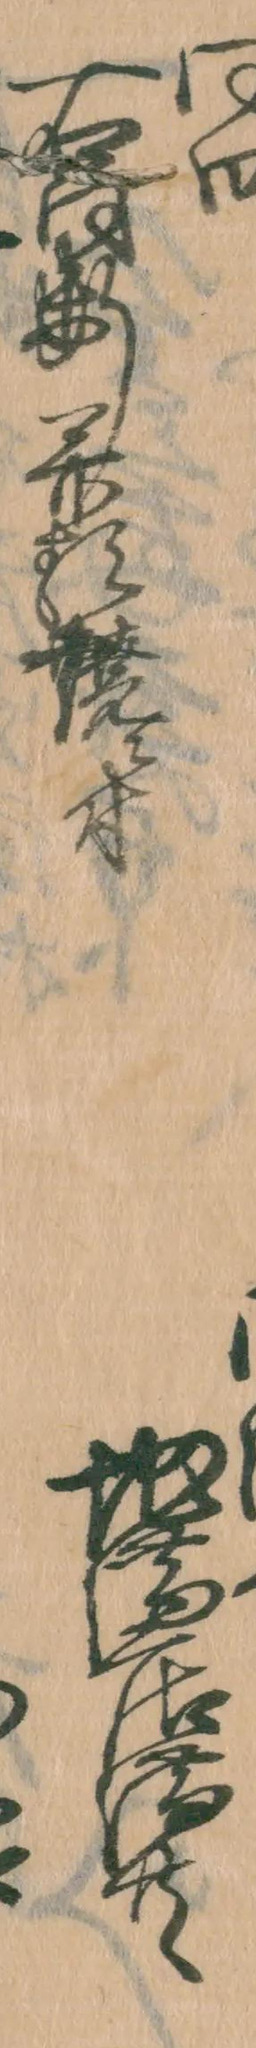右同断并類焼ニ付地借店借共
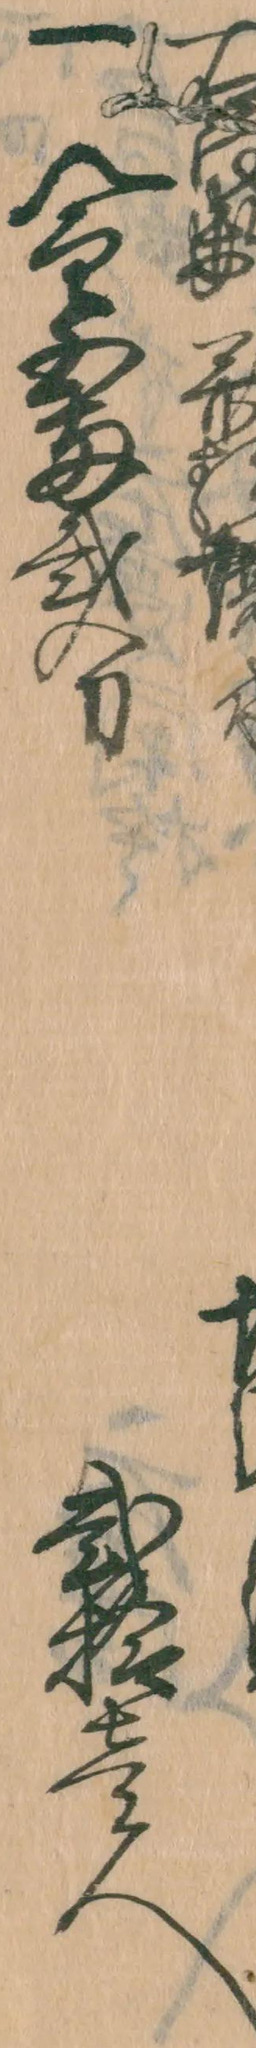一金五両弐分弐拾壱人
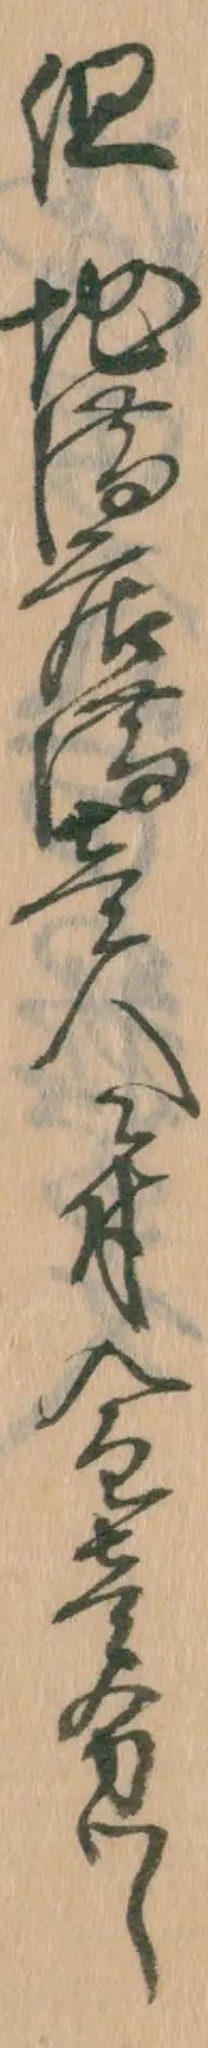但地借店借壱人ニ付金壱分ツヽ
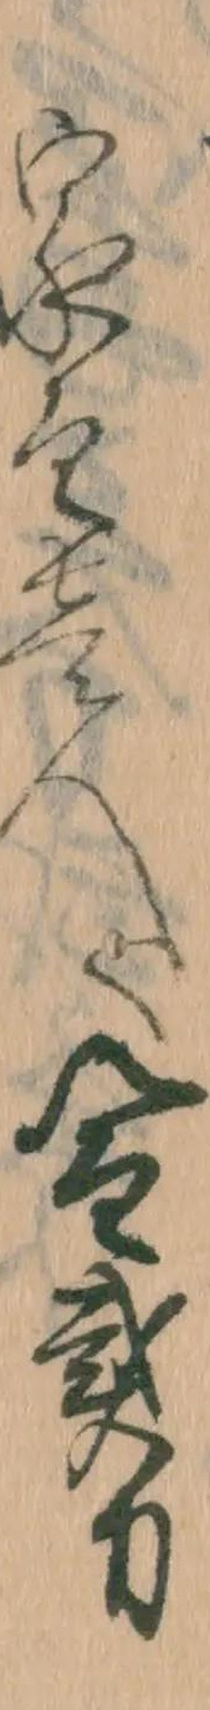家主壱人へ金弐分
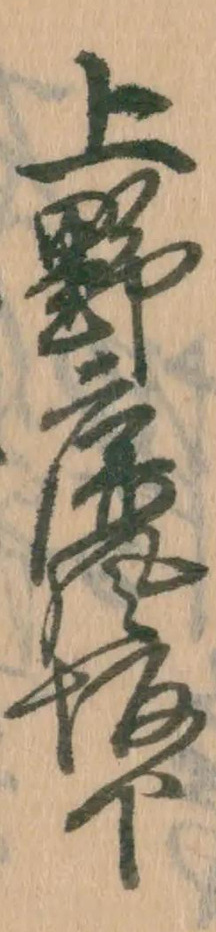上野屏風坂下
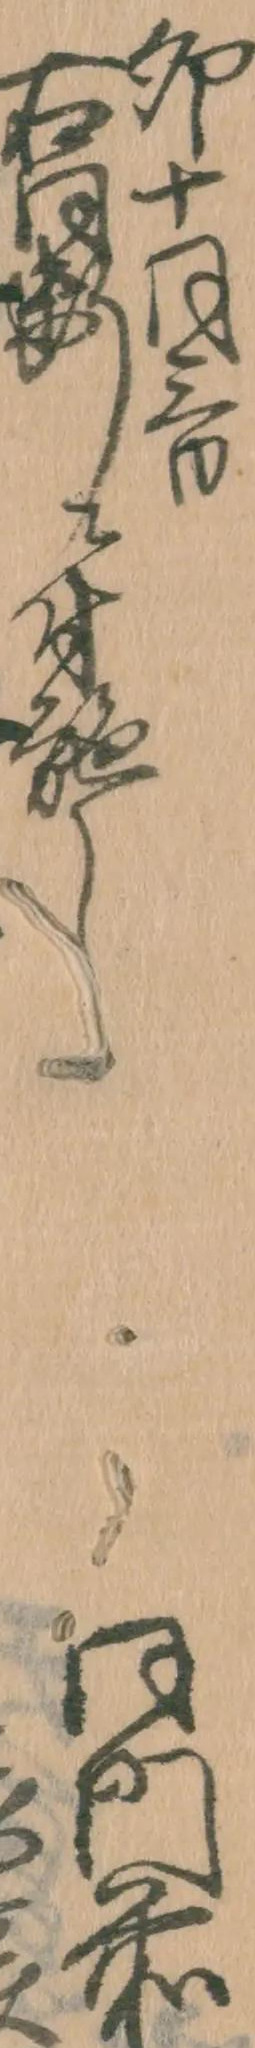右同断ニ付施し同門前
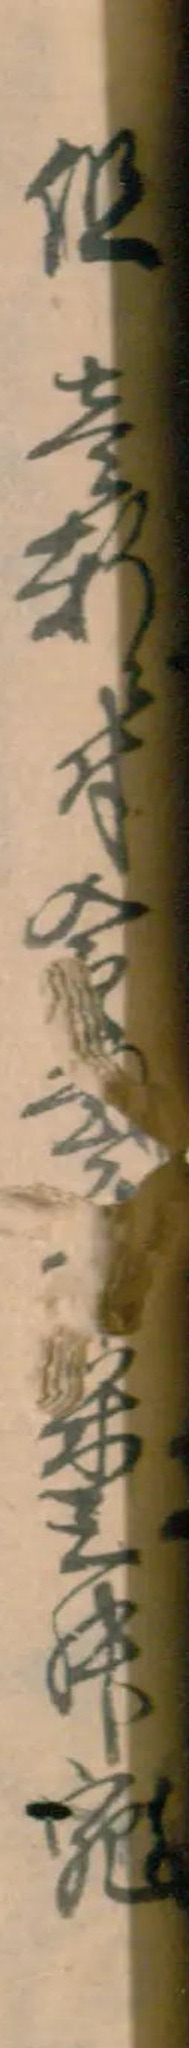但壱軒ニ付金弐朱米三升宛
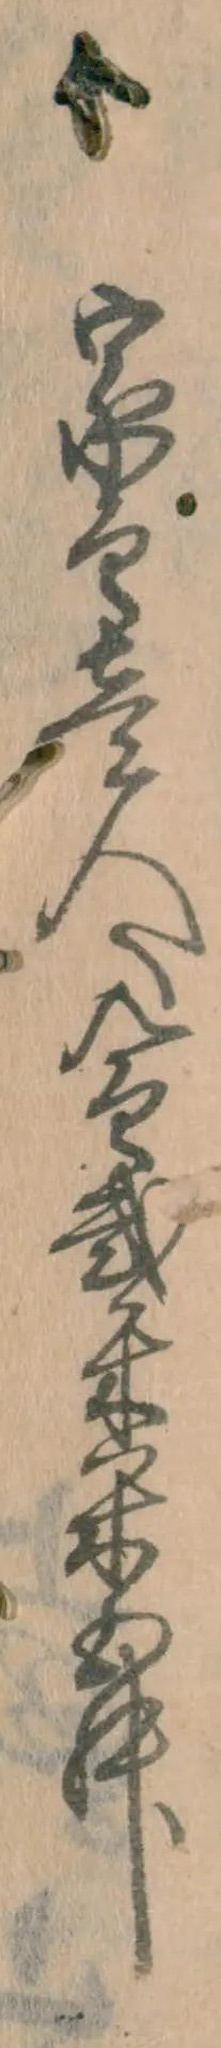家主壱人金弐朱米五升
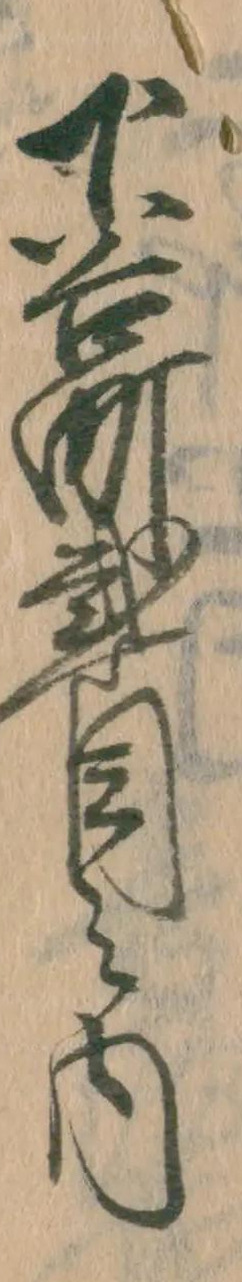下谷町弐丁目之内
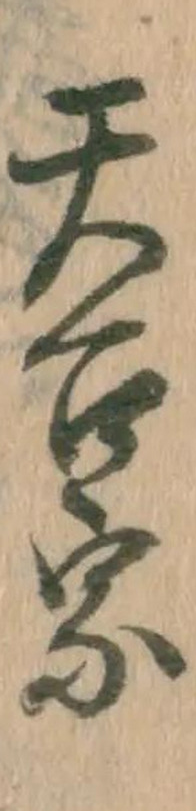天台宗

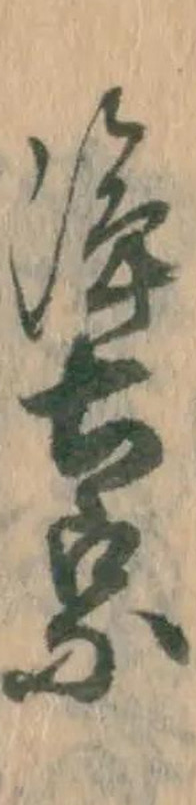浄土宗
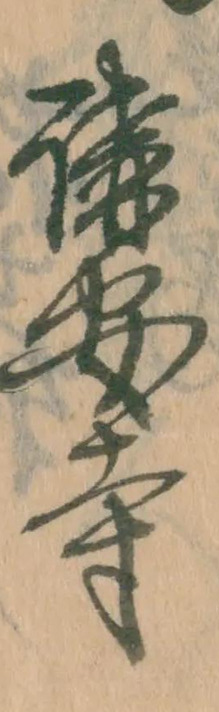講安寺
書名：武家方并寺院等ニテ施差出候一件
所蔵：国立国会図書館 National Diet Library, JAPAN
